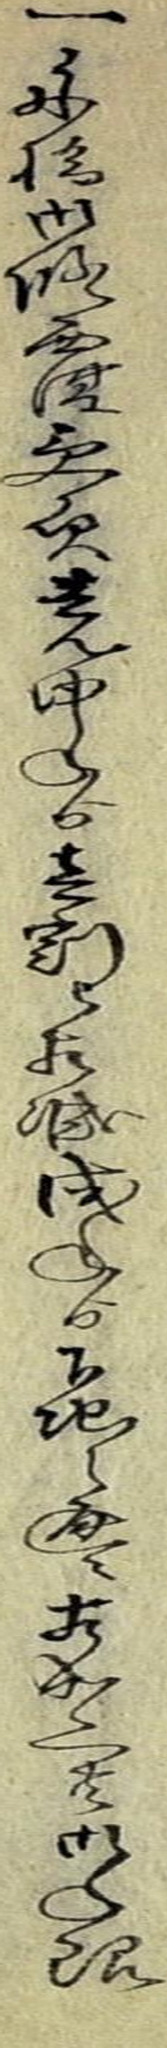一舟橋御修覆受負去ル申年ゟ壱割被相減戌年ゟ下地之通ニ相成候へ共御年限
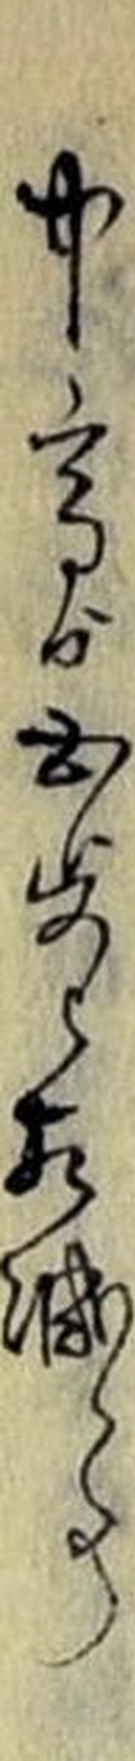中高ゟ五歩被相減候事
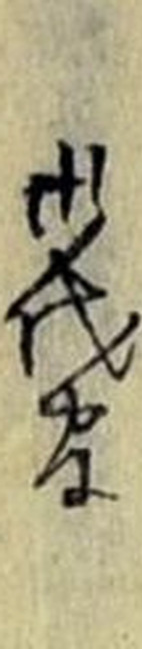御代官
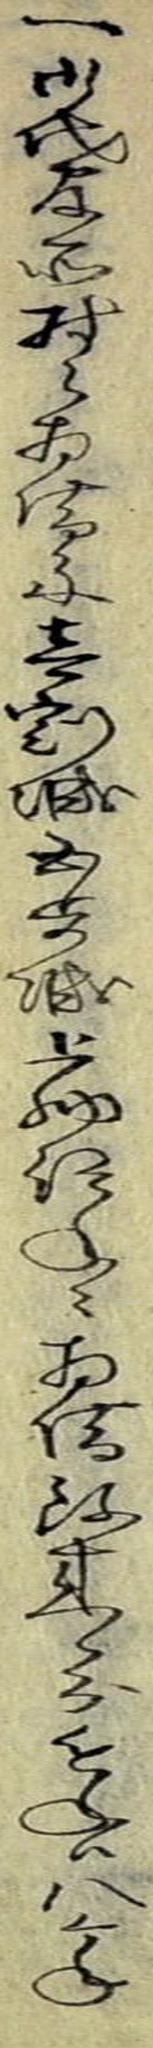一御代官所村々拝借米壱割減五歩減上納跡年々拝借致来候分近年ハ八ケ年
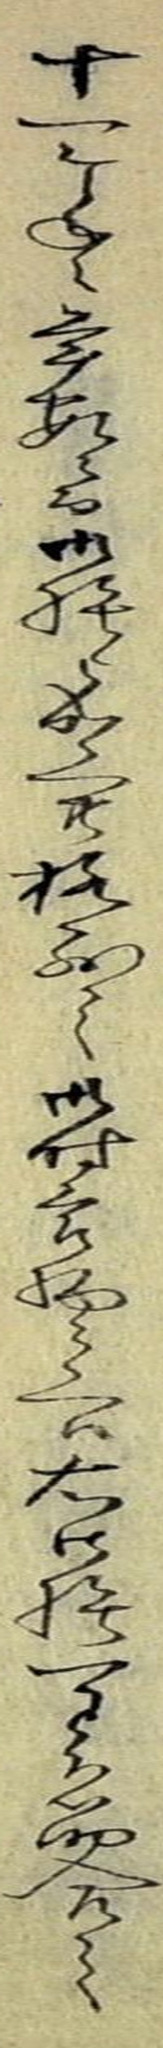十一ケ年之年数ニ而御捨被成候へ共格別之御時節柄ニ候へハ右御捨可被下筋合之
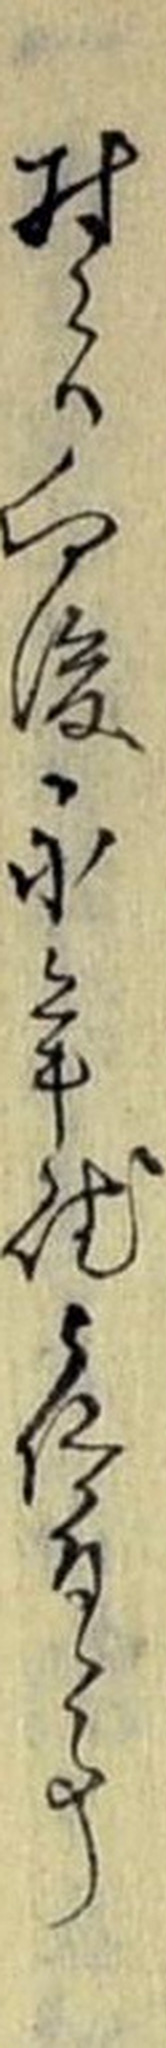村々ハ向後永年賦被仰付候事
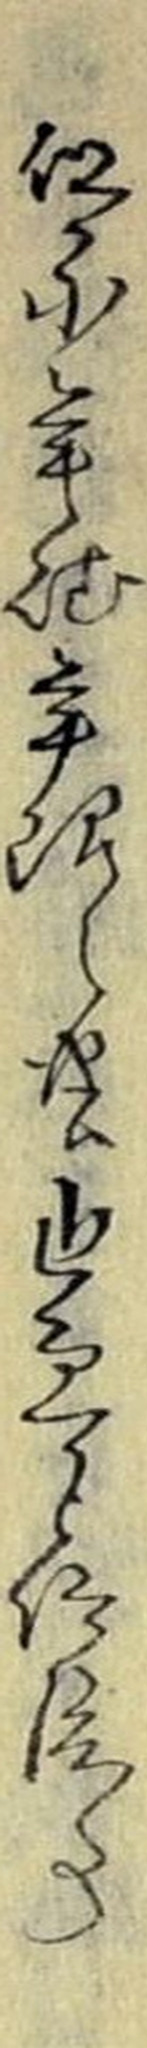但永年賦年限之儀ハ追廻而可被仰渡事
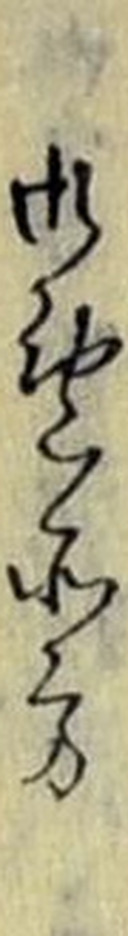御台所方
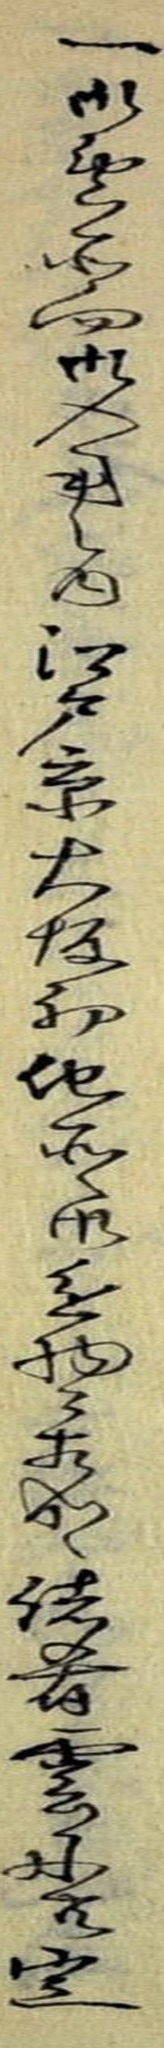一御台所向御入用之内江戸京大坂初他所へ御進物ニ相成候諸肴雲丹共定
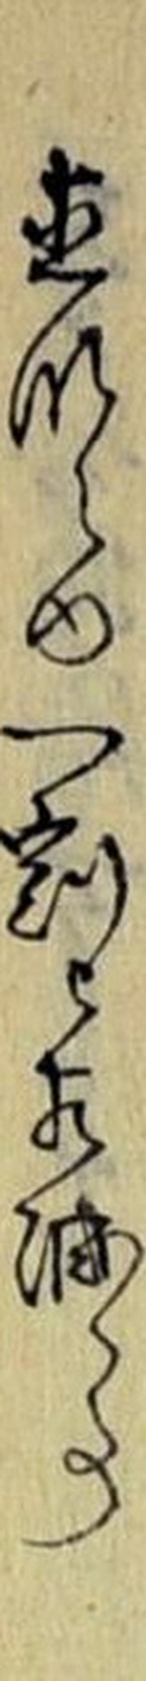直段之内一割被相減事
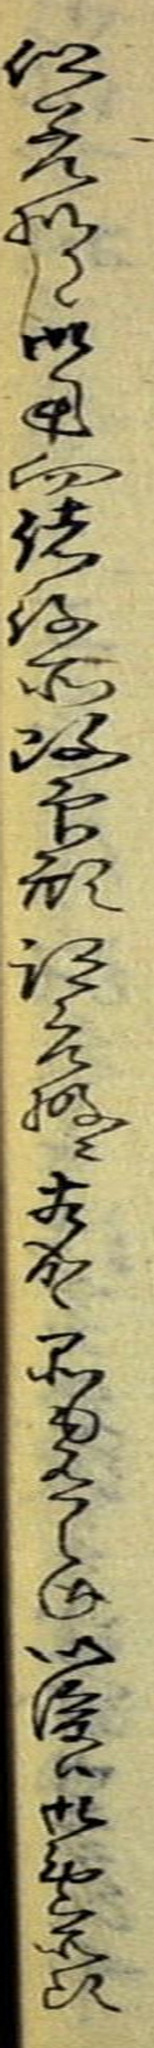但差掛り候御用向諸役所致印形跡取扱ニ相成候品も有之趣以後ハ御台所頭
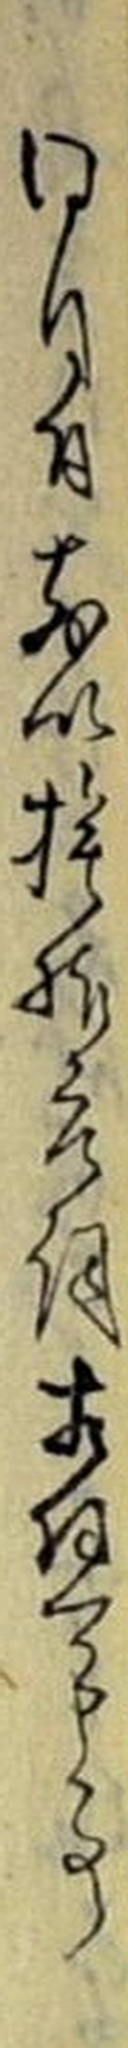同目付捨候様取調相伺可申事
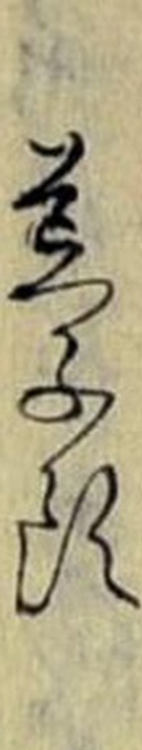荒子頭
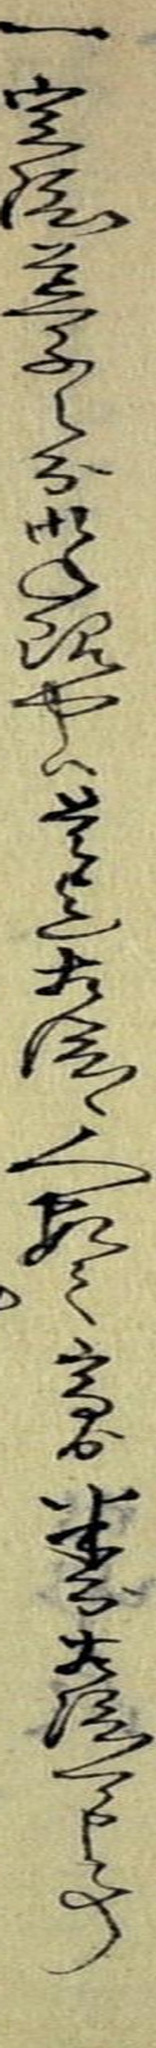一定渡荒子之分御年限中ハ是迄相渡候人数之高ゟ半分相渡可申事
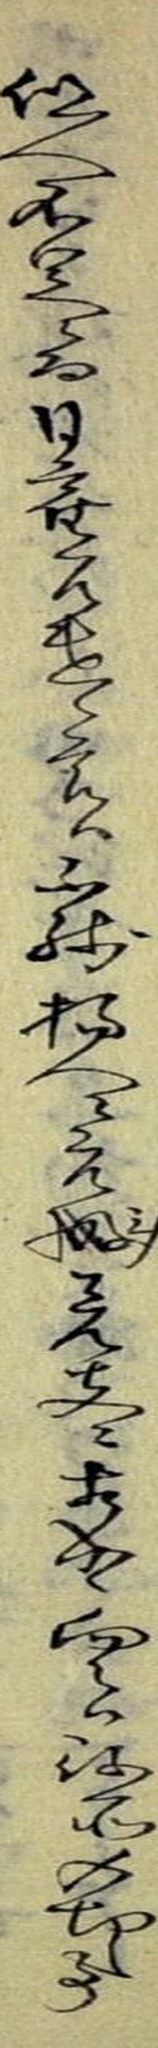但人不足ニ而日雇召遣候節ハ不残揚人ニ取扱計差支ニ相成候向々ハ役所〆切之事
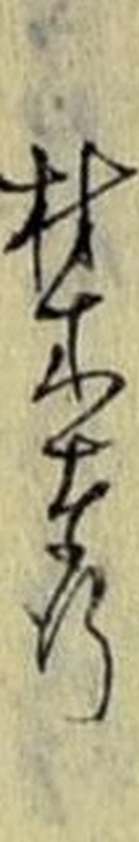材木奉行
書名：命令之部 五
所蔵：福井県文書館 Fukui Prefectural Archives
